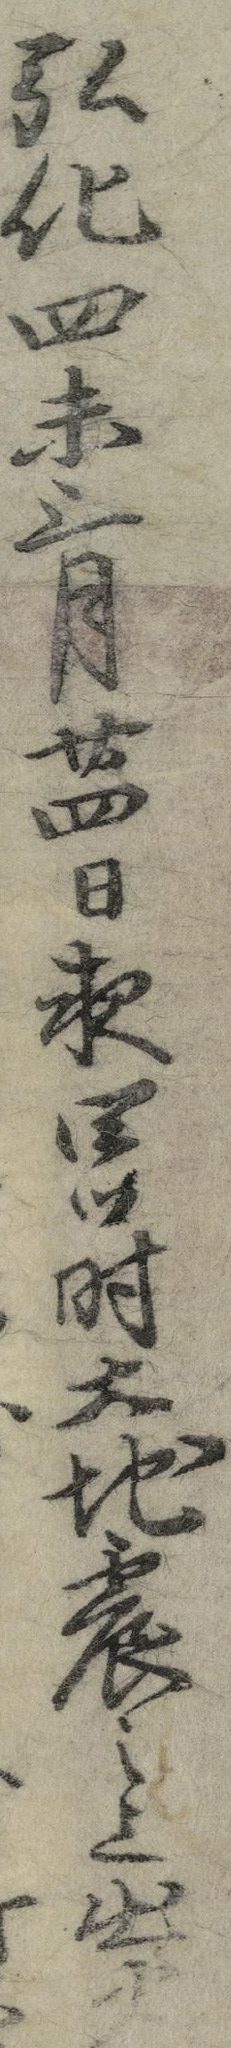弘化四未三月廿四日夜四ツ時大地震之上出火
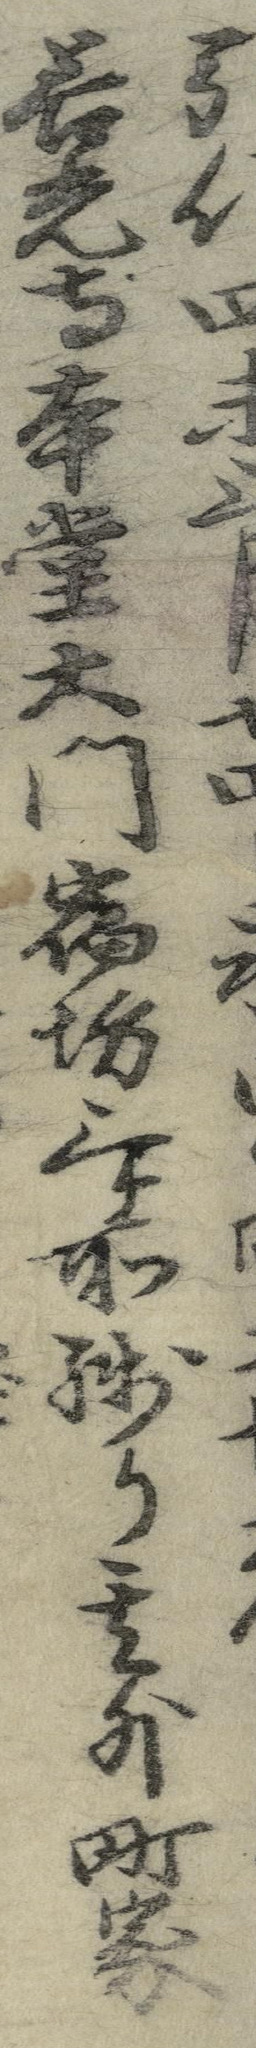善光寺本堂大門宿坊三ヶ所残り其外町家
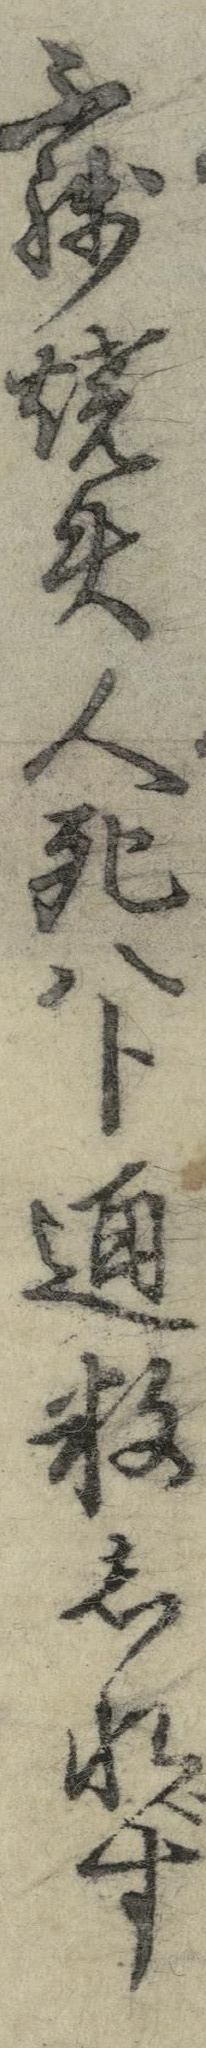不残焼失人死八卜通数しれず
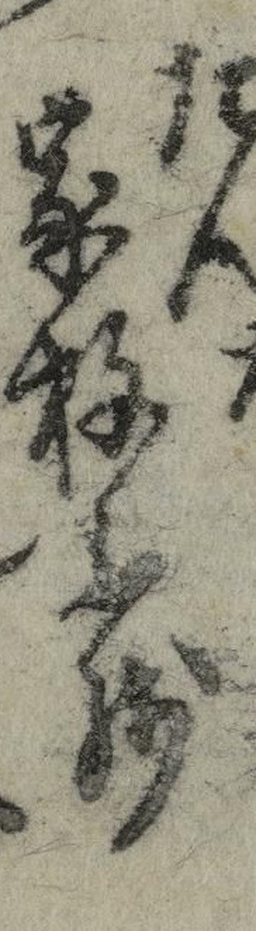家数不残
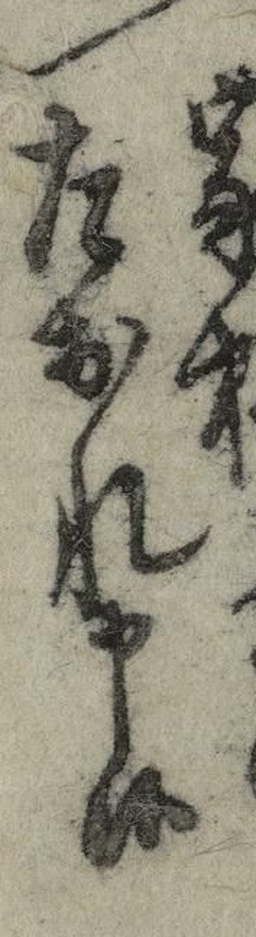たおれ申候
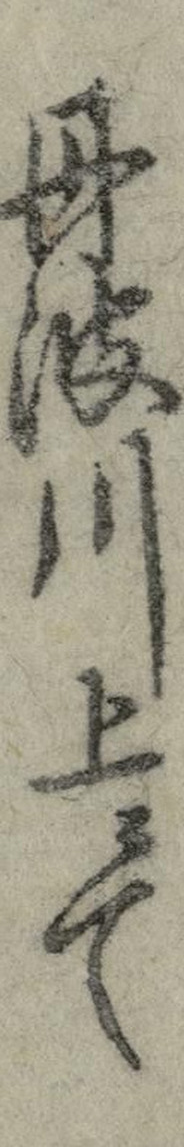丹波川上ニて
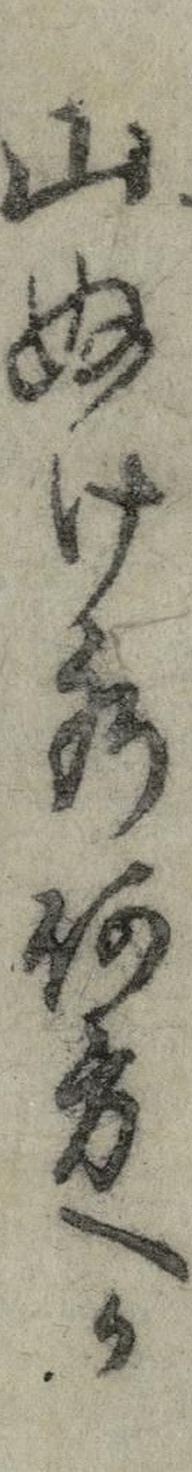山ぬけ水何方へか
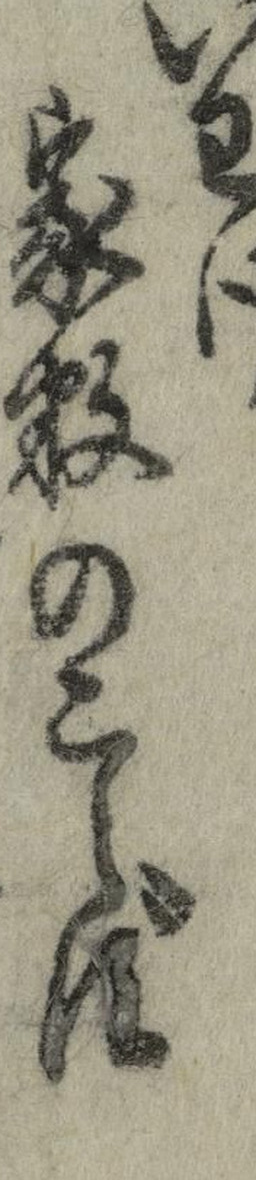家数のこらず
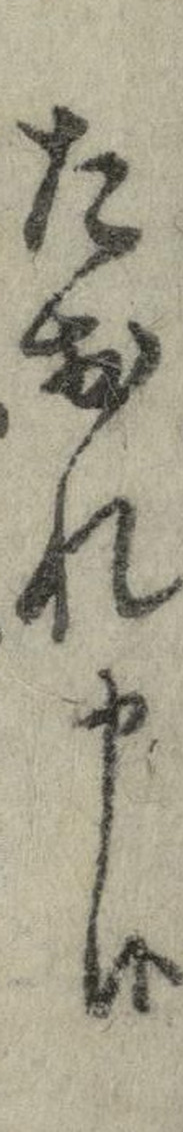たおれ申候
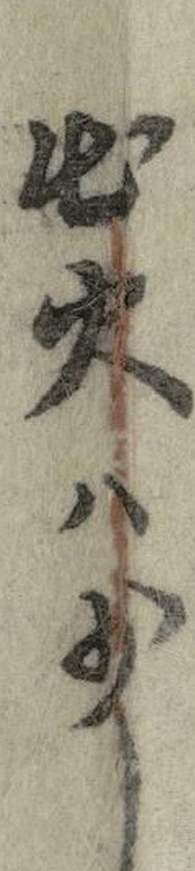出火ハ少し
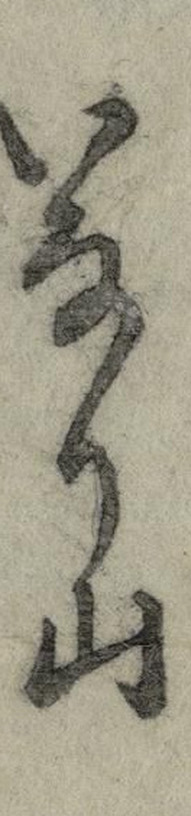いなり山
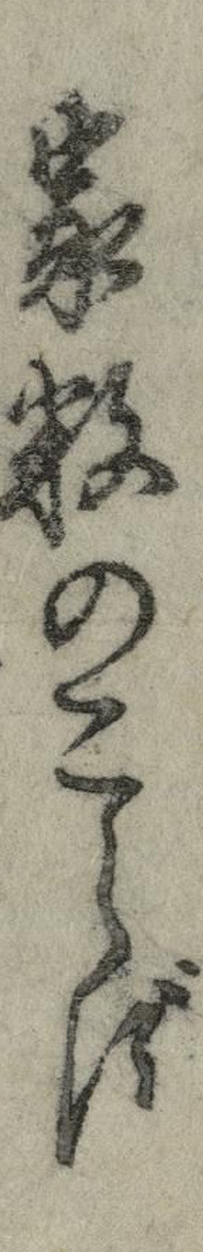家数のこらず
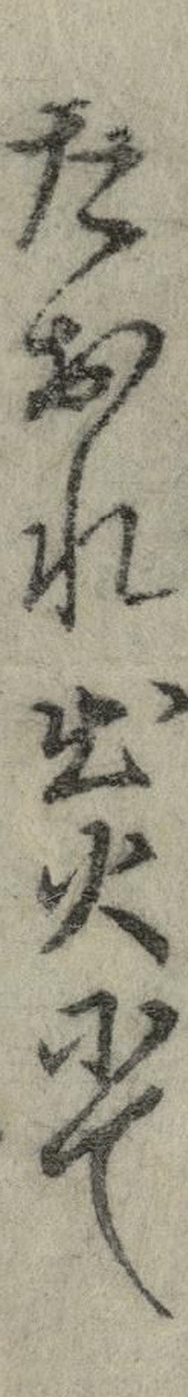たおれ出火にて
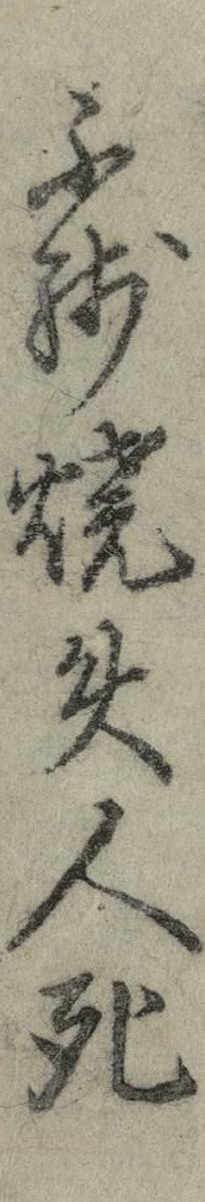不残焼失人死
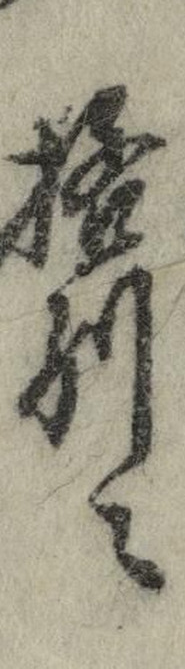格別ニ
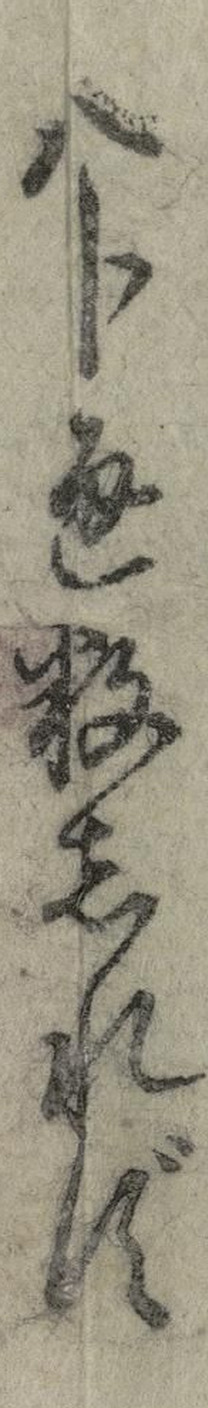八卜通数しれず
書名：[善光寺地震に関する瓦版]
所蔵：東京大学地震研究所図書室 Earthquake Research Institute Library, The University of Tokyo, JAPAN
